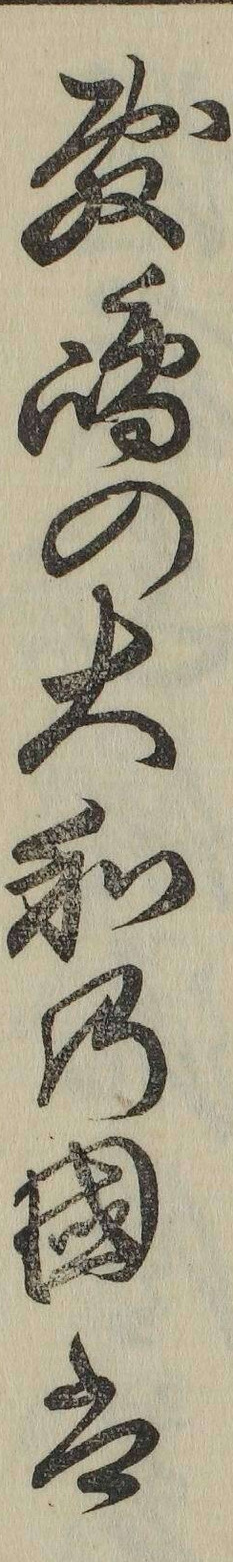敷嶋の大和の國は
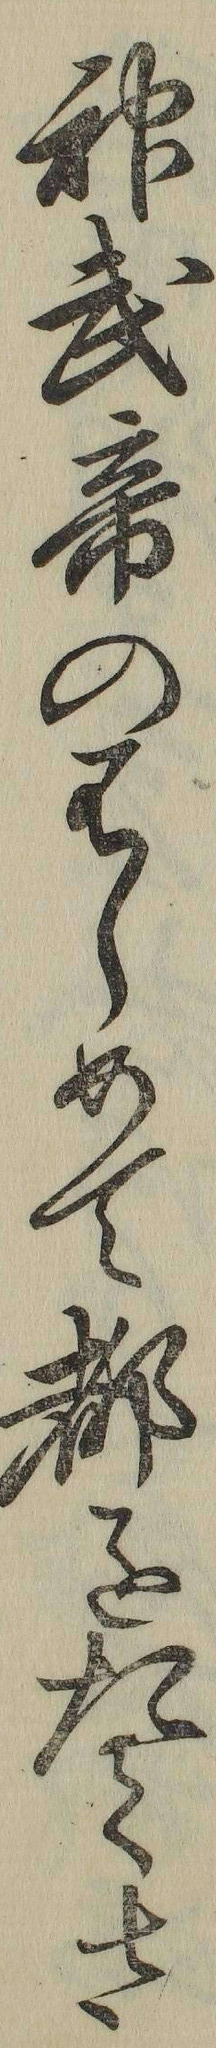神武帝のはしめて都をたてさ
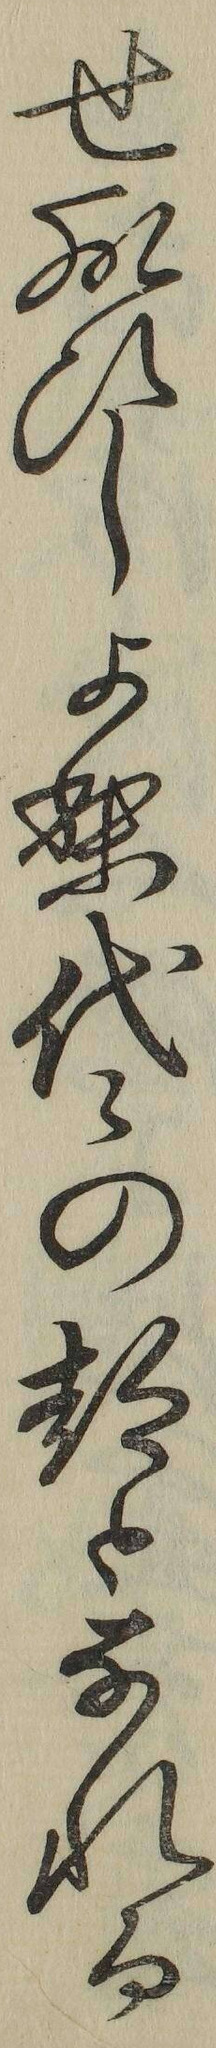せ給ひしより代々の都となれる
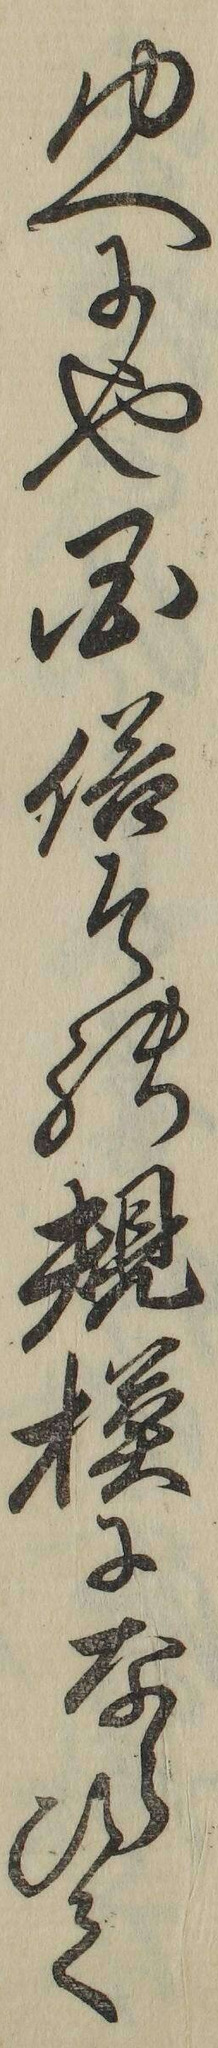ゆへにや国俗その規摸にならひて
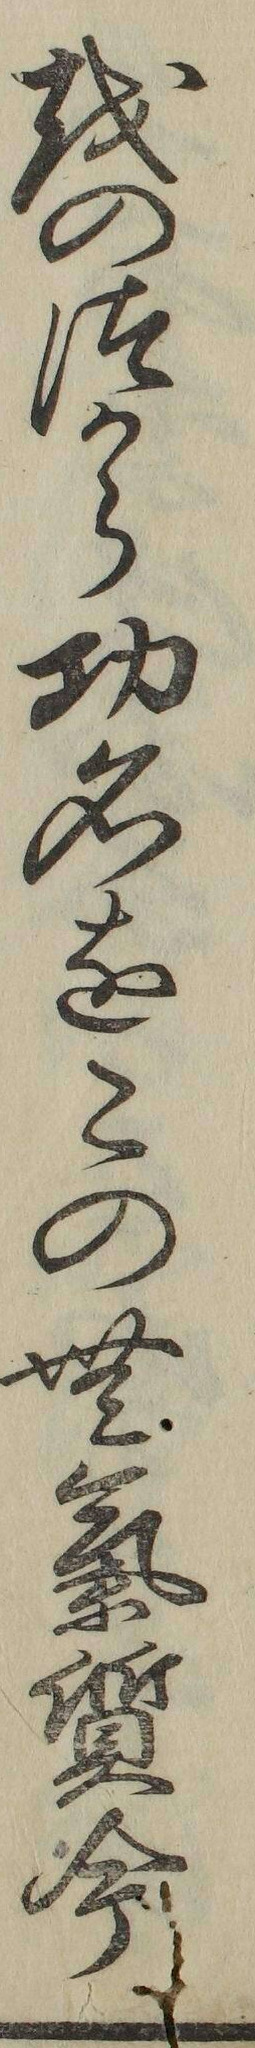をのつから功名をこの世氣質今

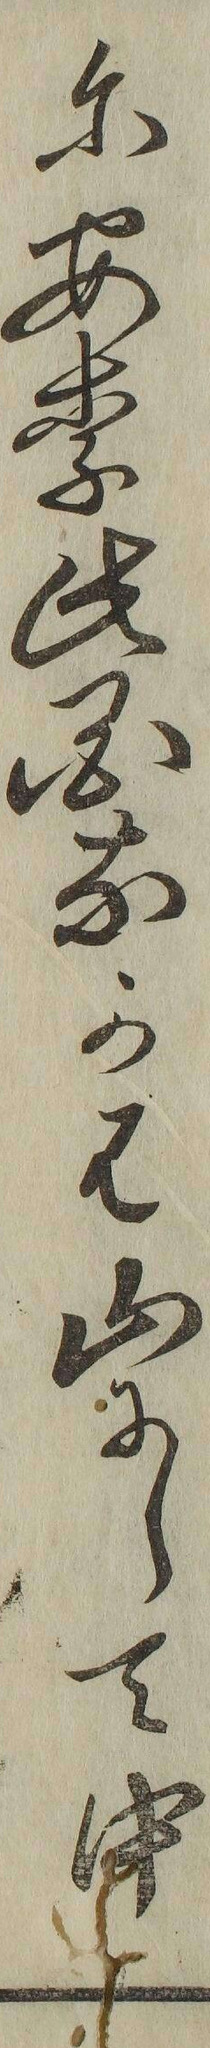にあり此国なかは山にして中
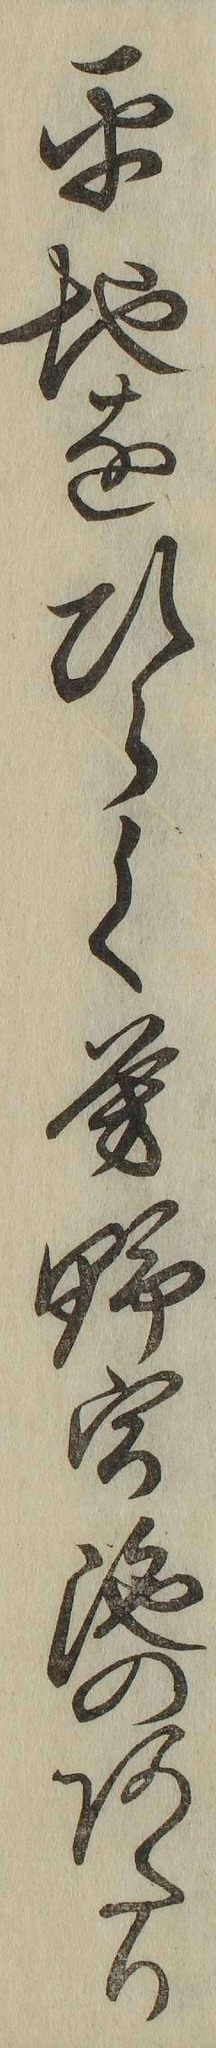平地をひらく芳野宇陁のあたり
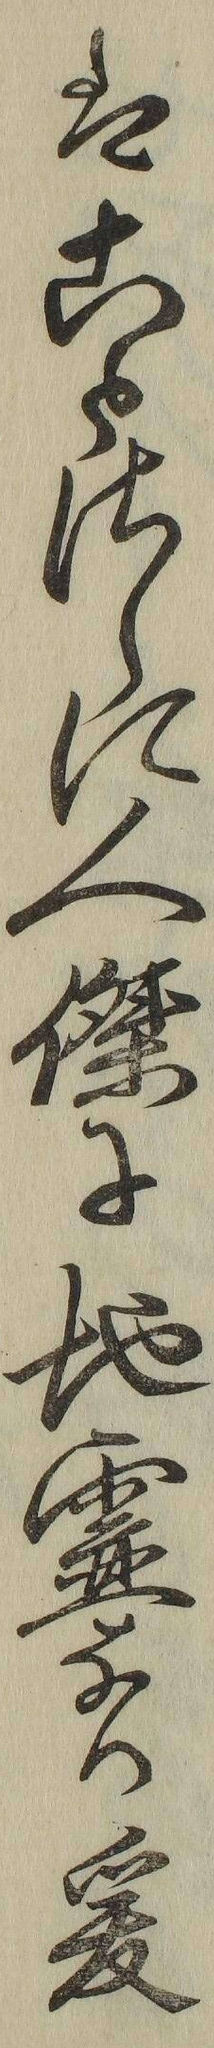はことさらに人傑に地靈なり爰
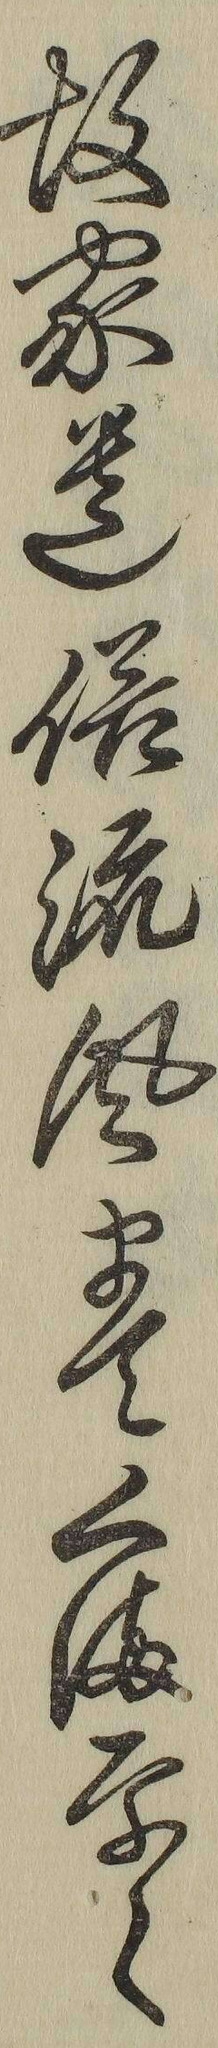故家道俗流風まてくまなく
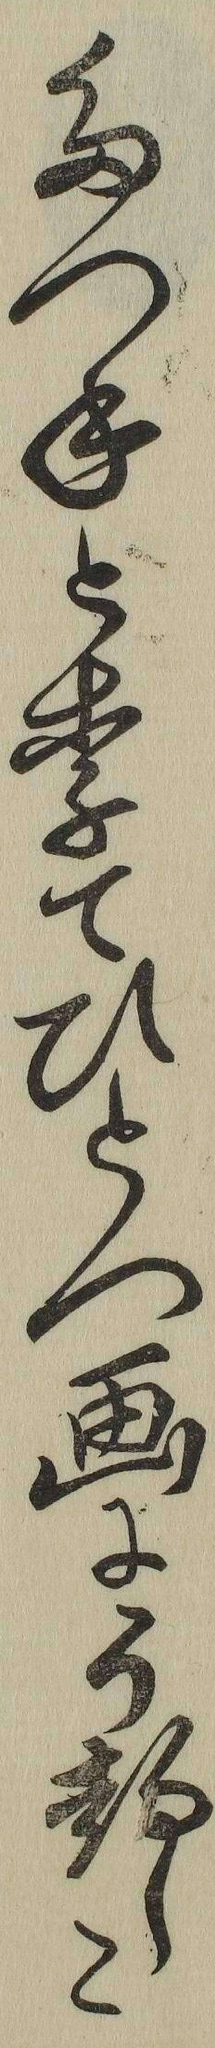たつねときてひとつ画にかきしこ
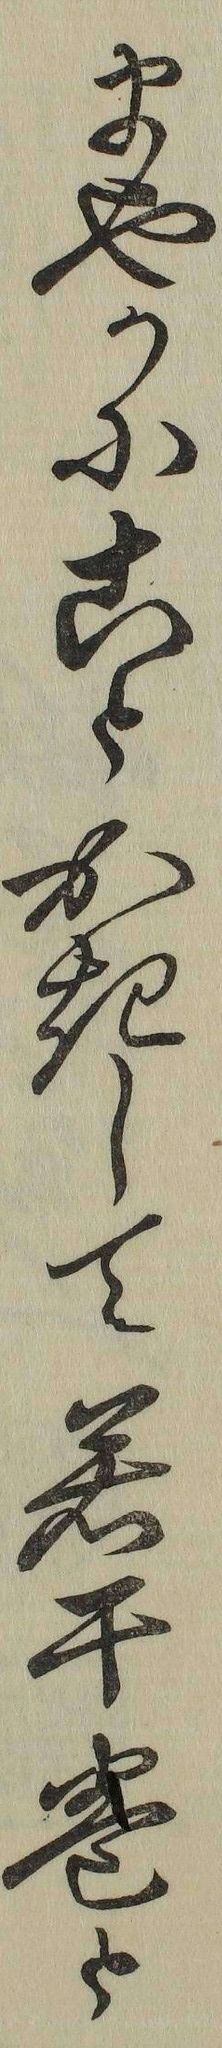まやかにことかきして若干巻と
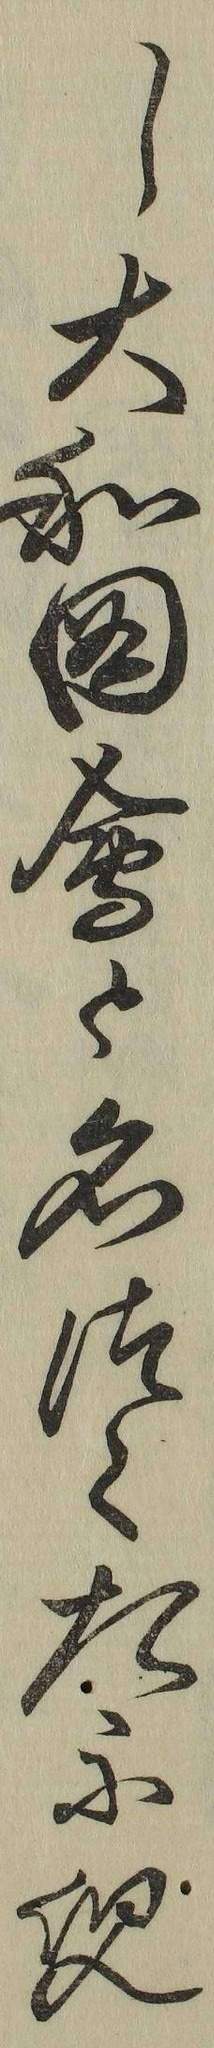し大和図會と名つくたに児
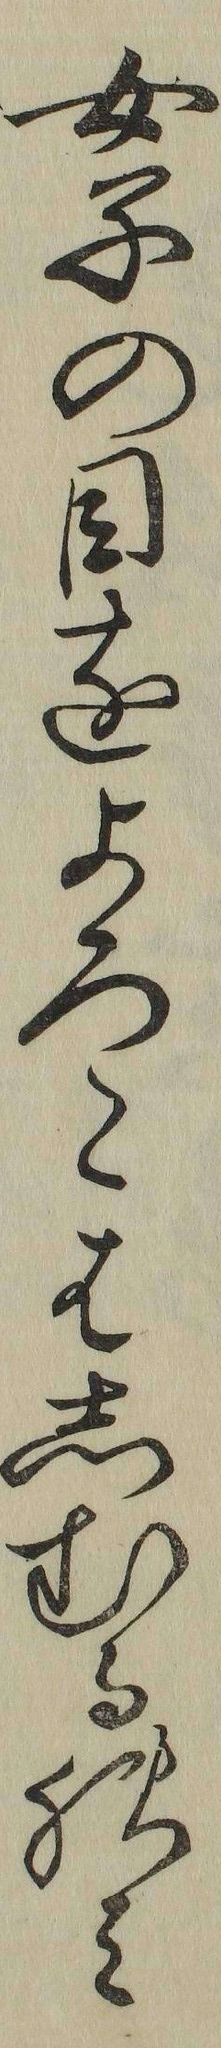女子の目をよろこはしむる給は
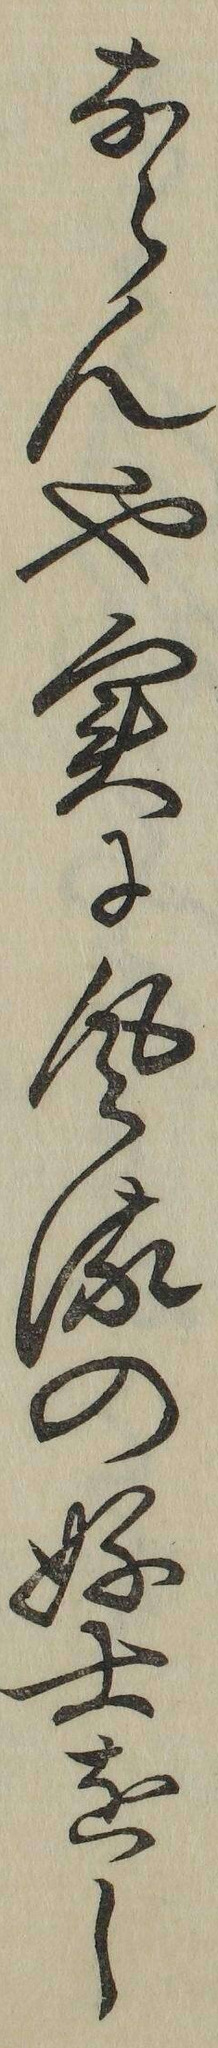ならんや実に風流の好士をし
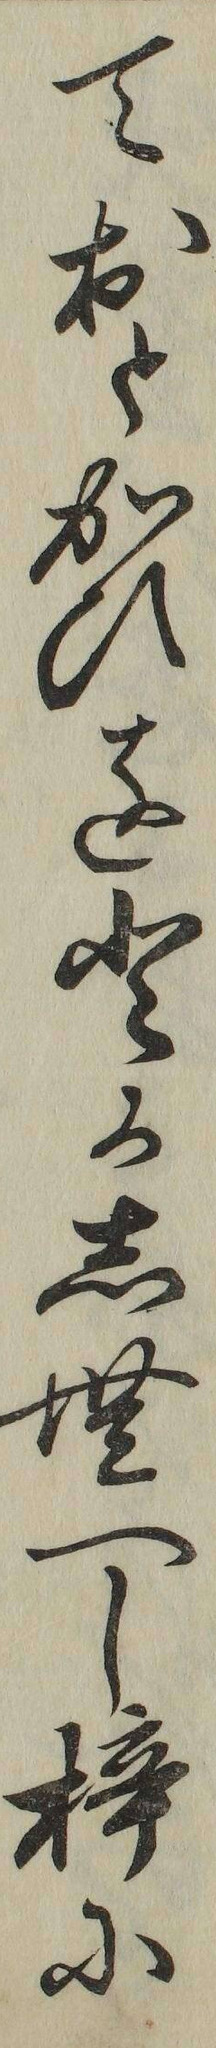ておとかひをとかしむへし梓に
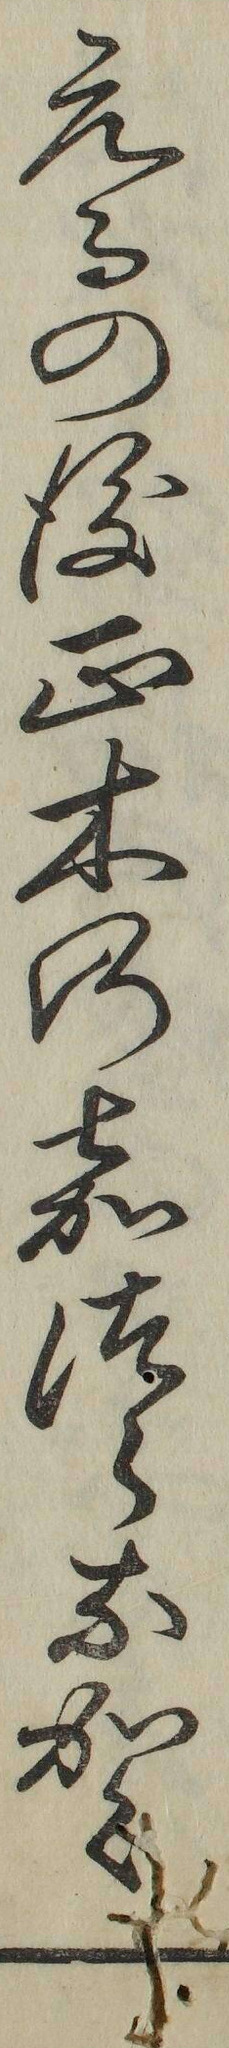えるの後正木のかつらなかく
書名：大和名所圖會
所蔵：国文学研究資料館
